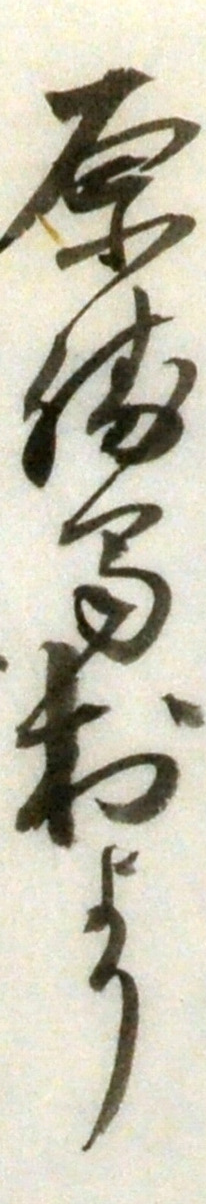原勝間村より
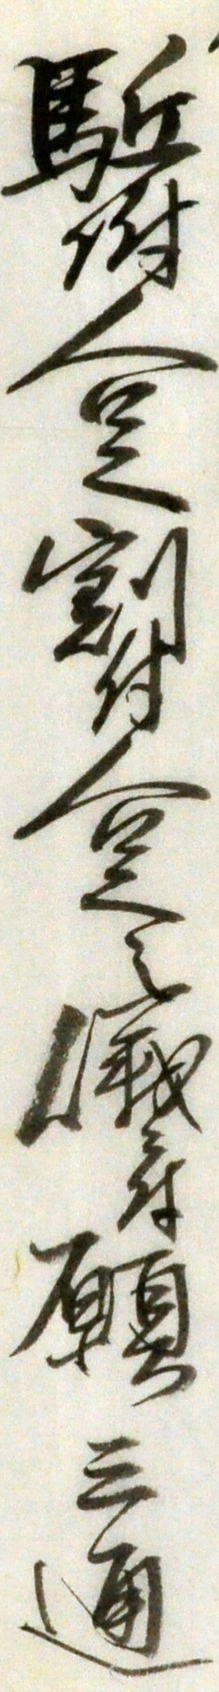駈附人足割付人足之儀ニ付願三通
